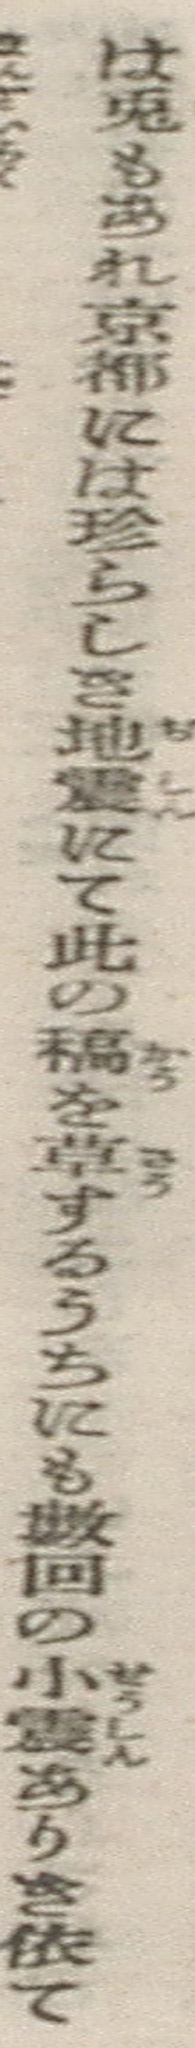は兎もあれ京都には珍らしき地震にて此の稿を草するうちにも數回の小震ありて依て
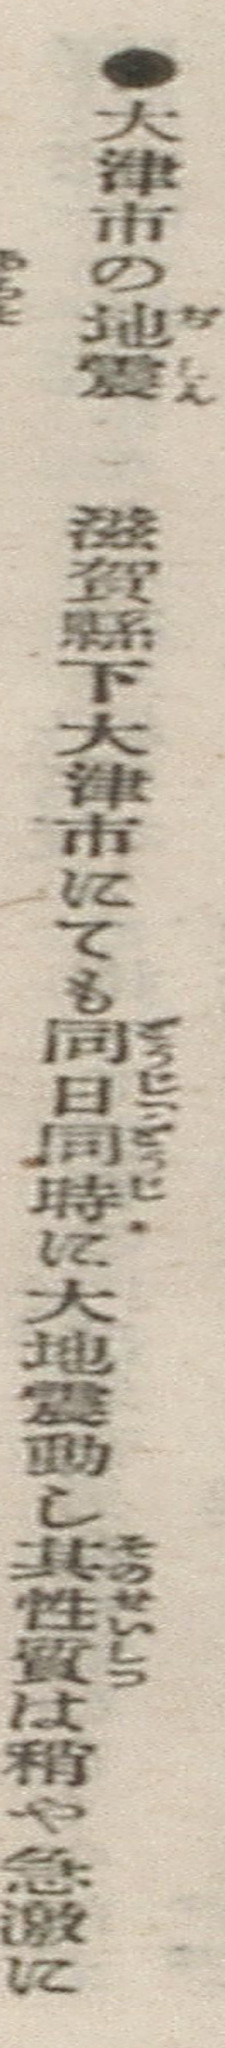●大津市の地震滋賀県下大津市にても同日同時に大地震動し其性質は稍や急激に
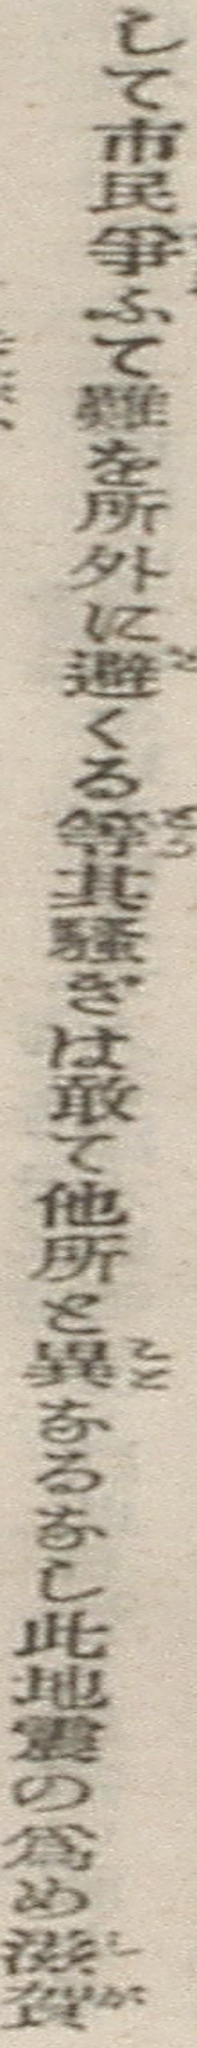して市民争ふて難を所外に避くる等其騒ぎは敢て他所と異なるなし此地震の為め滋賀
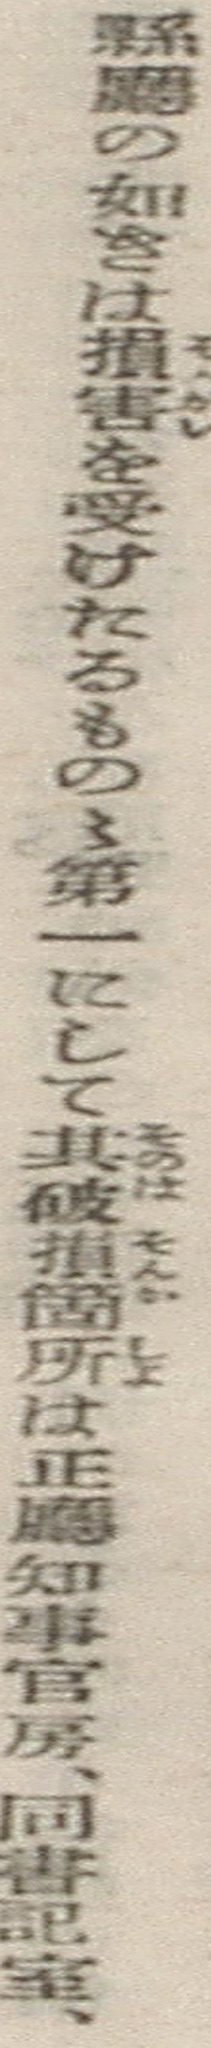県廰の如きは損害を受けたるものゝ第一にして其破損箇所は正廰知事官房、同書記室、
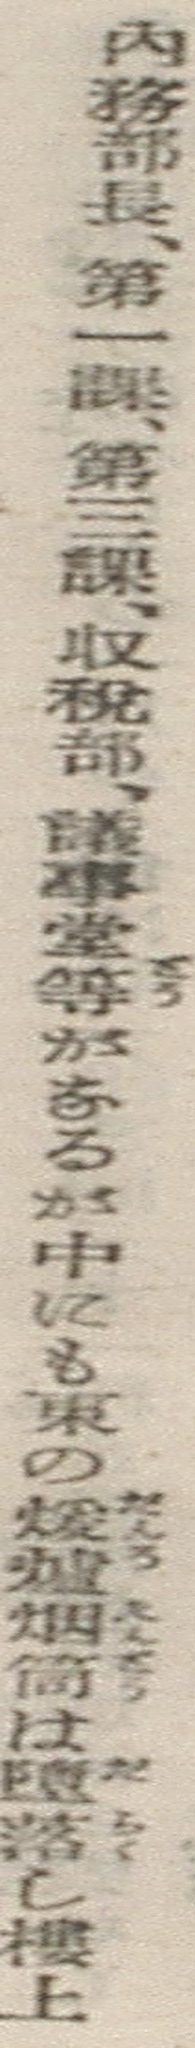内務部長、第一課、第三課、収税部、議事堂等がなるが中にも東の暖爐烟筒は堕落し樓上
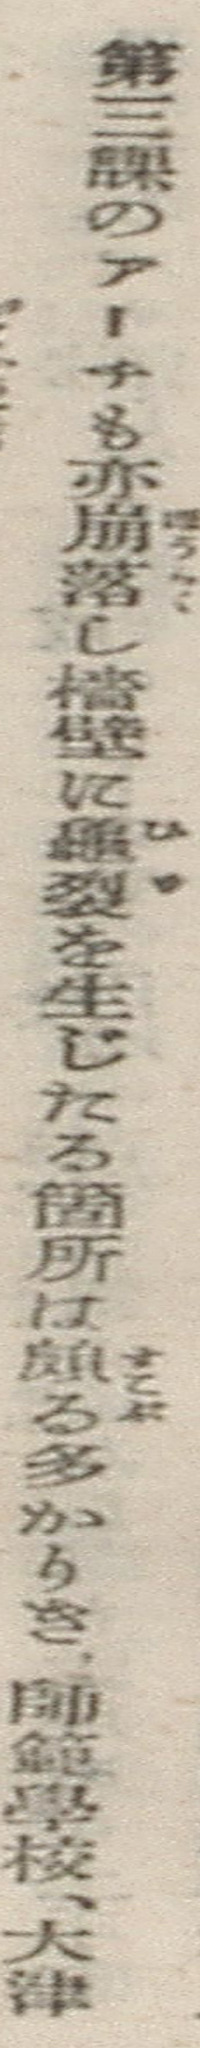第三課のアーチも亦崩落し檣壁に龜裂を生じたる箇所は頗る多かりき、師範学校、大津
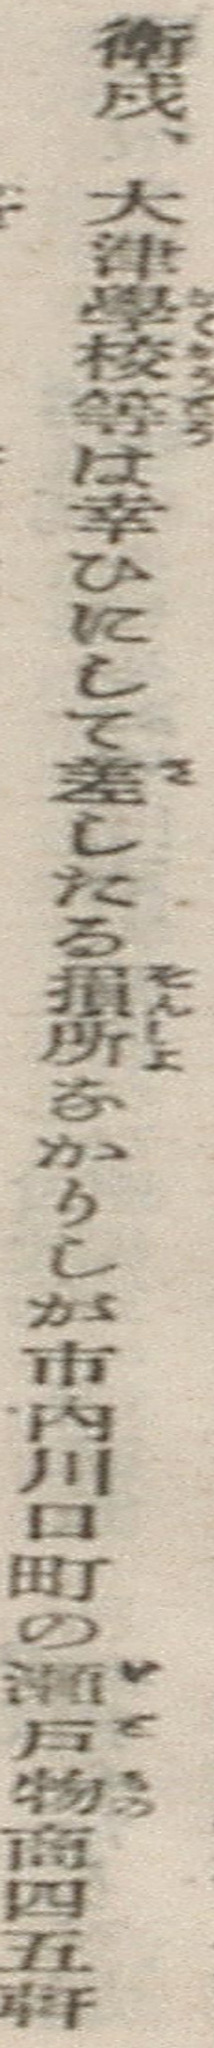衛戌、大津學校等は幸ひにして差したる損所なかりしが市内川口町の瀬戸物商四五軒
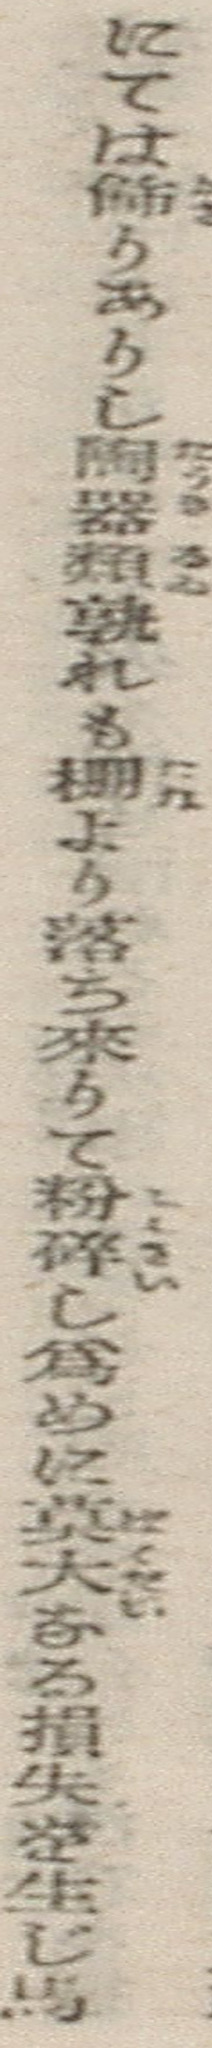にては飾りありし陶器類孰れも棚より落ち来りて粉砕し為めに莫大なる損失を生じ馬
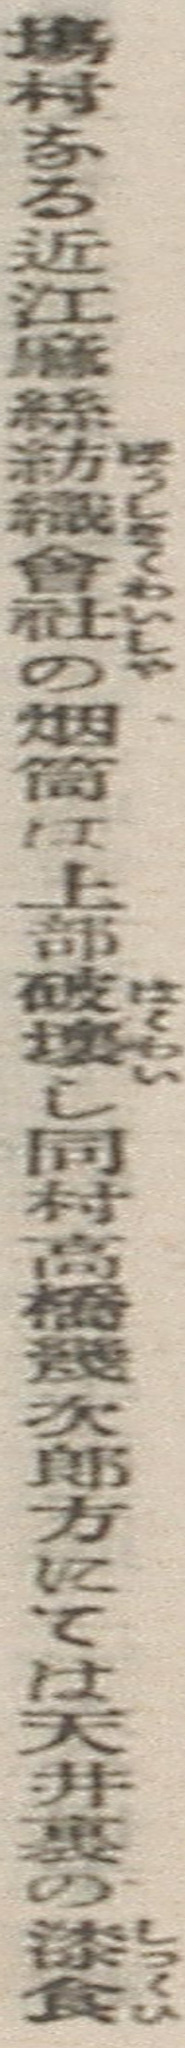場村なる近江麻絲紡績會社の烟筒は上部破壊し同村高橋幾次郎方にて天井裏の漆食
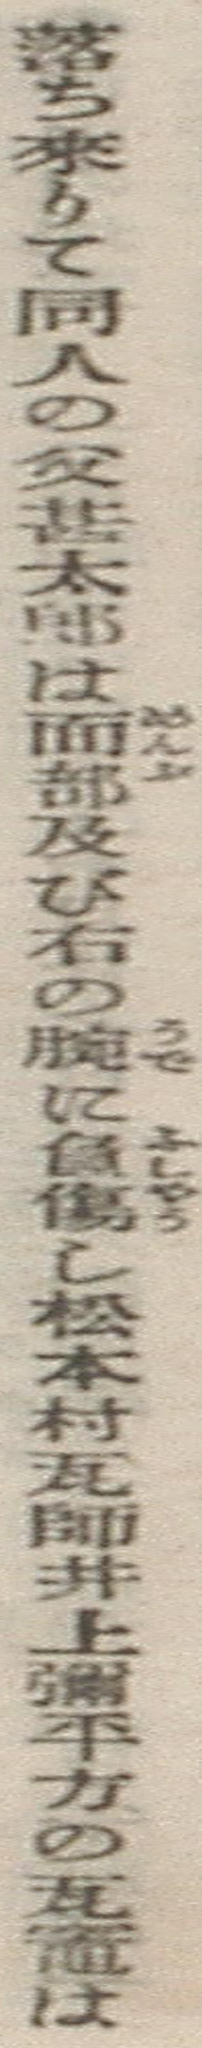落ち来りて同人の父甚太郎は面部及び右の腕に負傷し松本村瓦師井上彌平方の瓦竃は
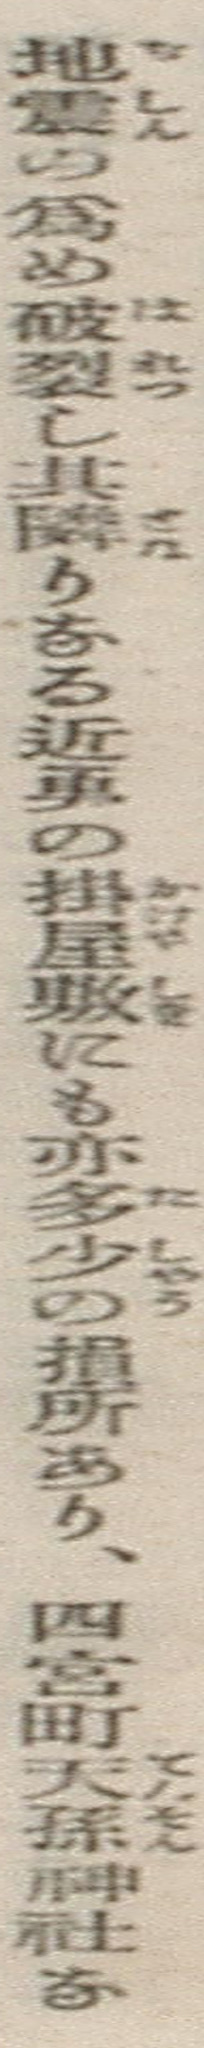地震の為め破裂し其隣りなる近更の掛屋敷にも亦多少の損所あり、四宮町天孫神社な
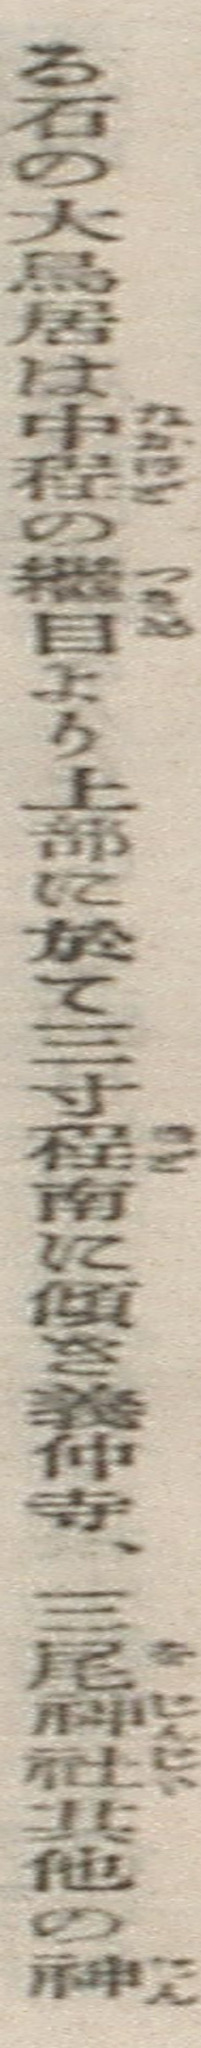る石の大鳥居は中程の継目より上部に於て三寸程南に傾き義仲寺、三尾神社其他の神
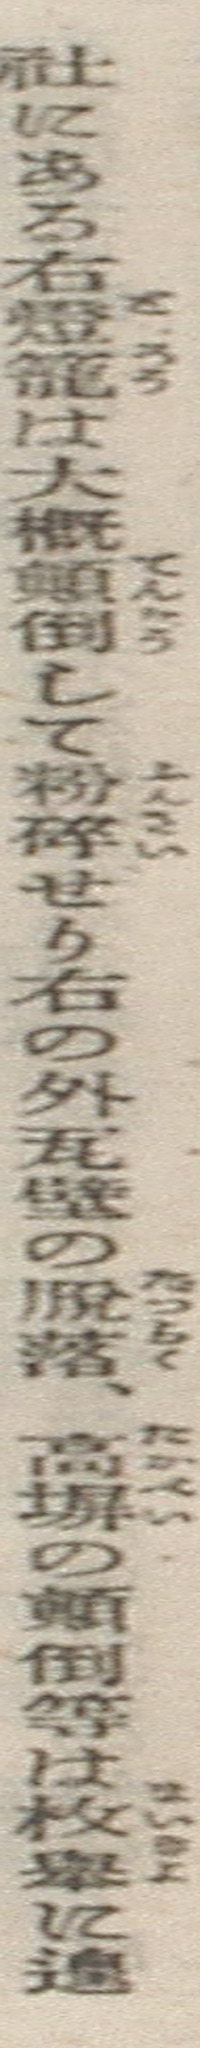社にある右燈籠は大概顛倒して粉砕せり右の外瓦壁の脱落、高塀の顛倒等は枚擧に遑
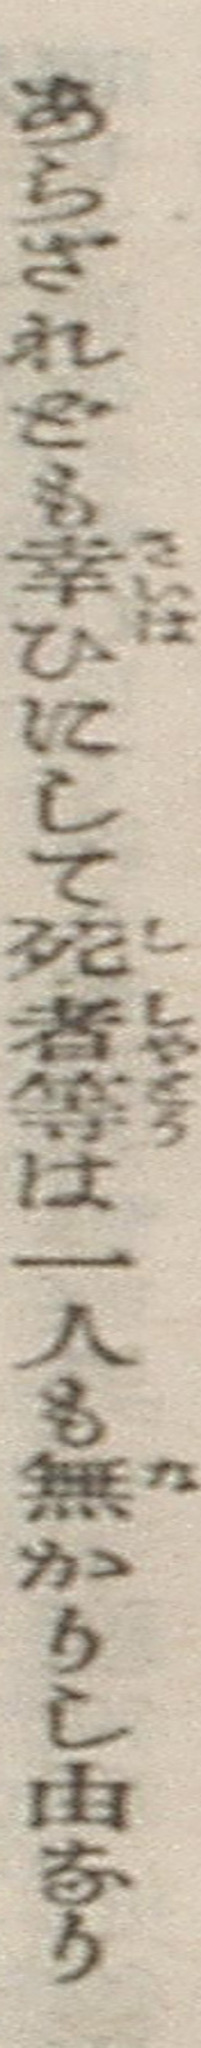あらざれども幸ひにして死者等は一人も無かりし由なり
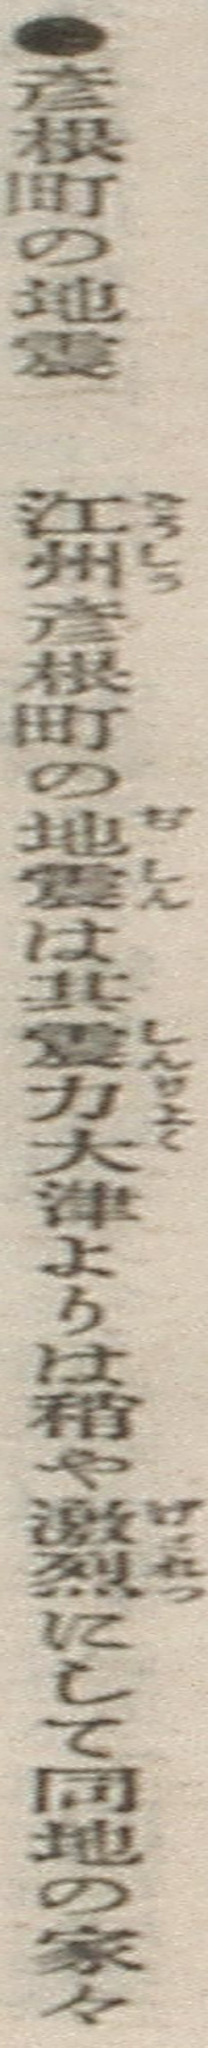●彦根町の地震江州彦根町の地震は其震力大津よりは稍や激烈にして同地の家々
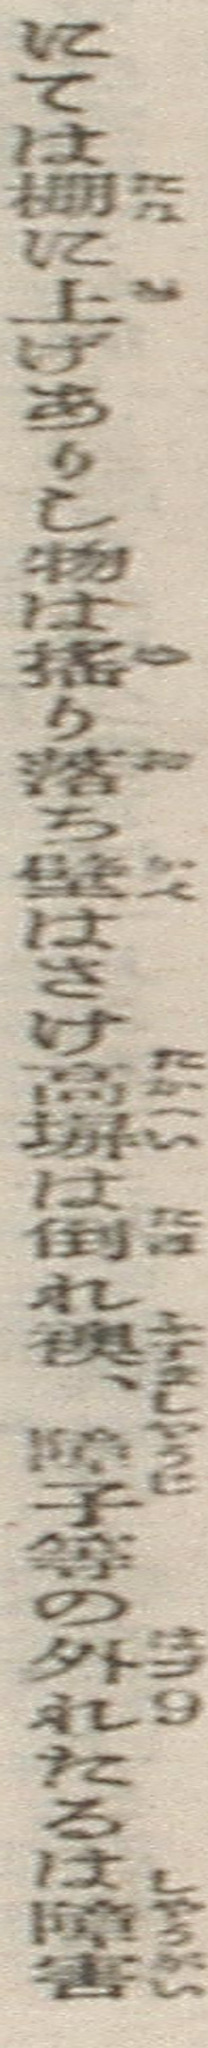にては棚に上げありし物は揺り落ち壁はさけ高塀は倒れ襖、障子等の外れたるは障害
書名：愛知岐阜福井三県　大地震見聞録（内題）
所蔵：東京大学地震研究所図書室 Earthquake Research Institute Library, The University of Tokyo, JAPAN
